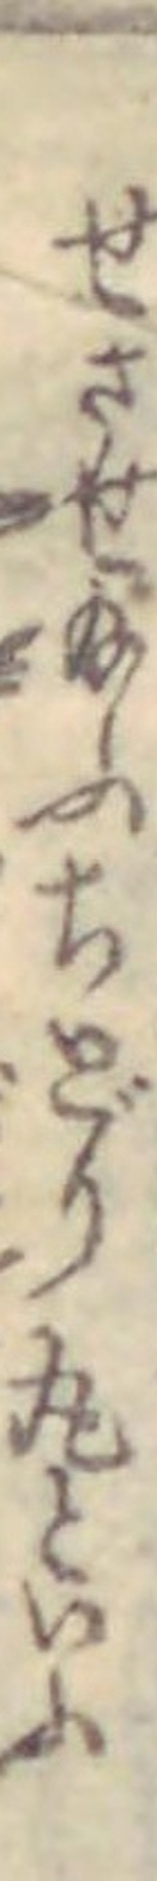せさせ給ふちどり丸といふ
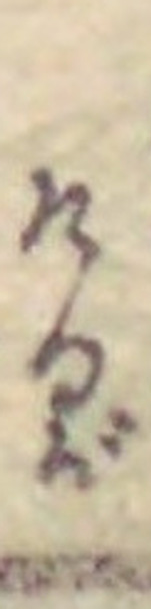けるが
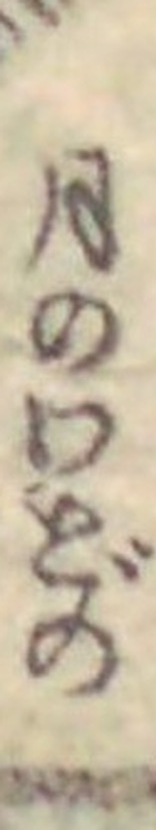月のわどの
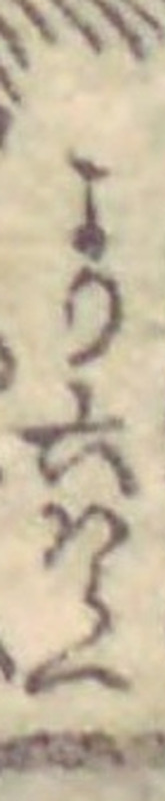より六はらへ
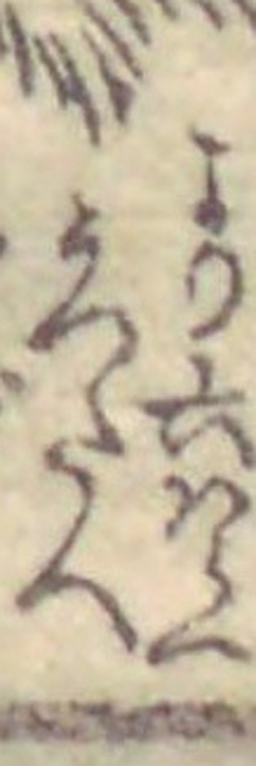うつたへ
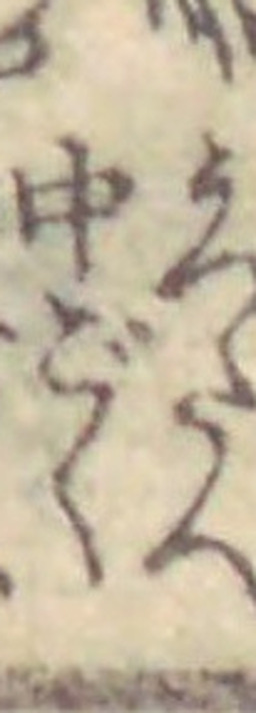中ごく
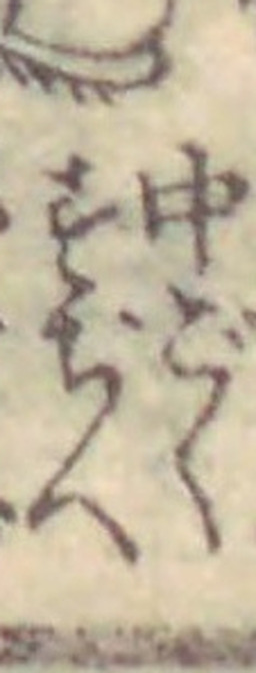すじへ
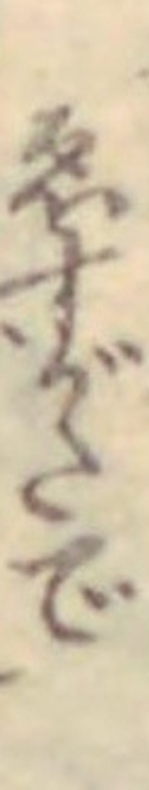ゑすがたで
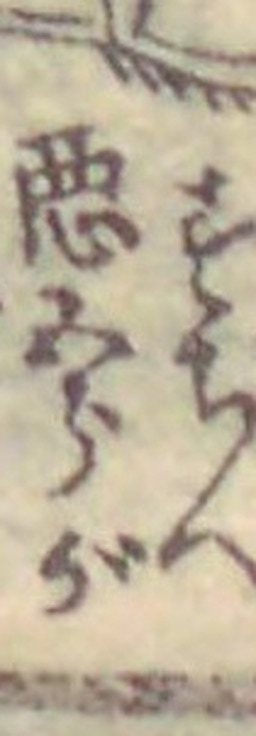悪五郎が
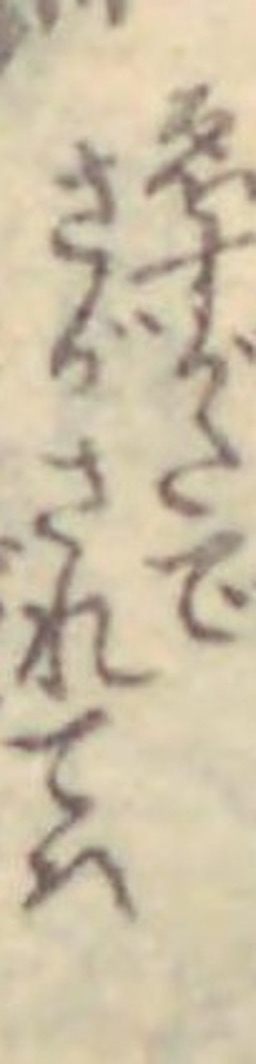さがされては
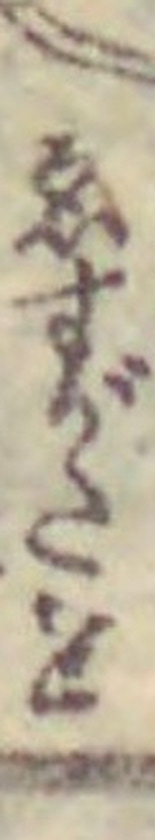ゑすがたを
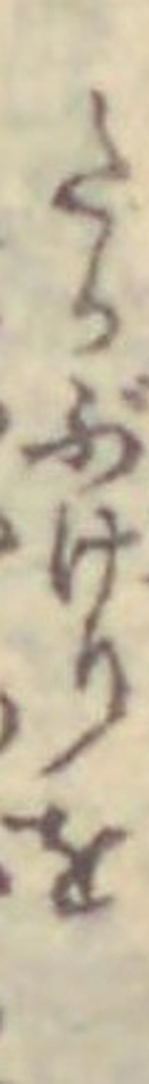たかぶけりを
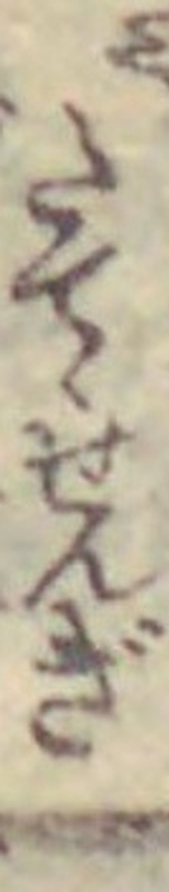たてゝせんぎ
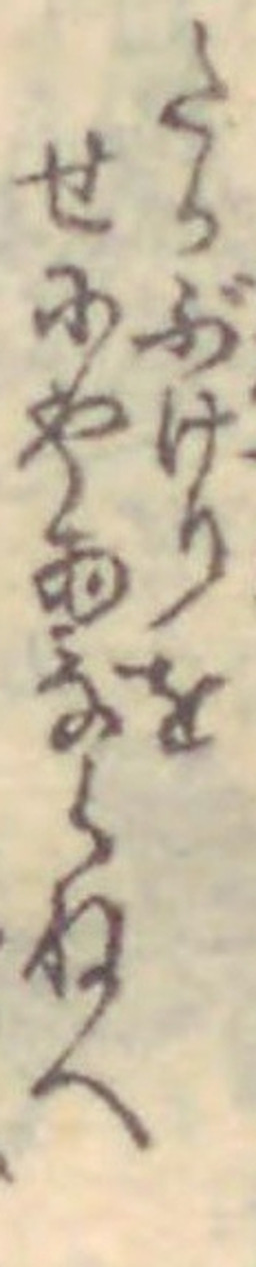せにやあならねへ
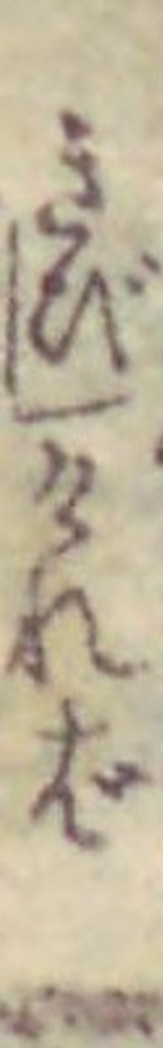きびしければ
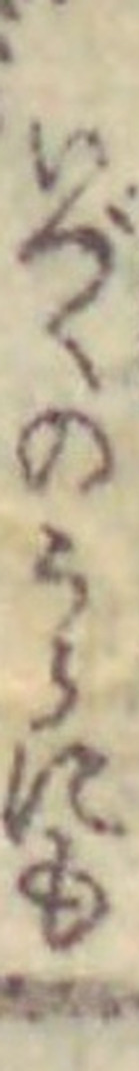いづくのうらにも
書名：八ツ目鱣因縁物語 3巻
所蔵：国立国会図書館 National Diet Library, JAPAN
